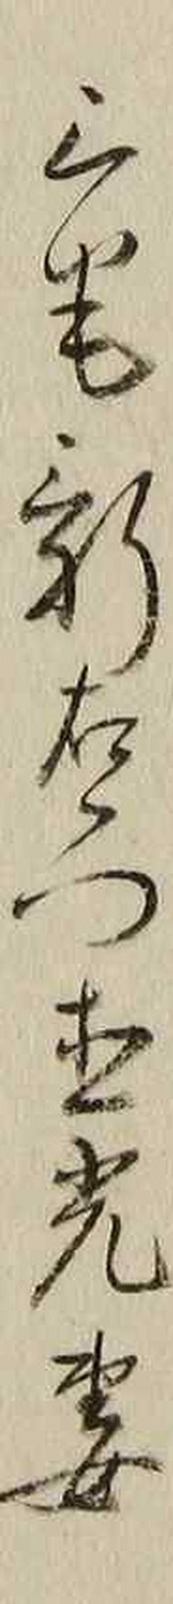三宅新右衛門直光妻
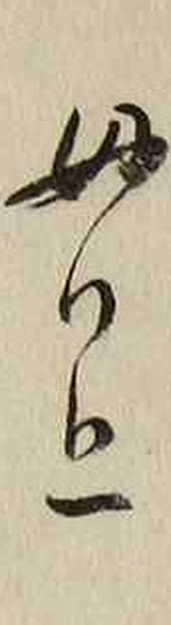母同上
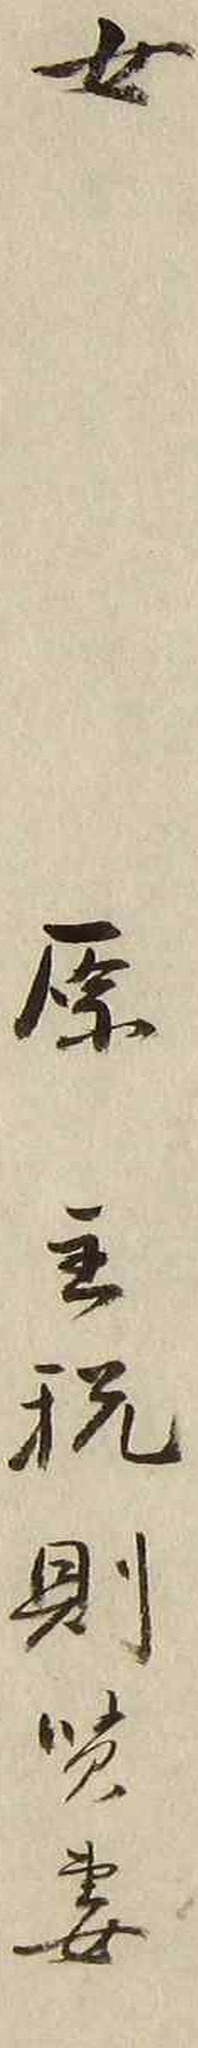女原主税則賢妻
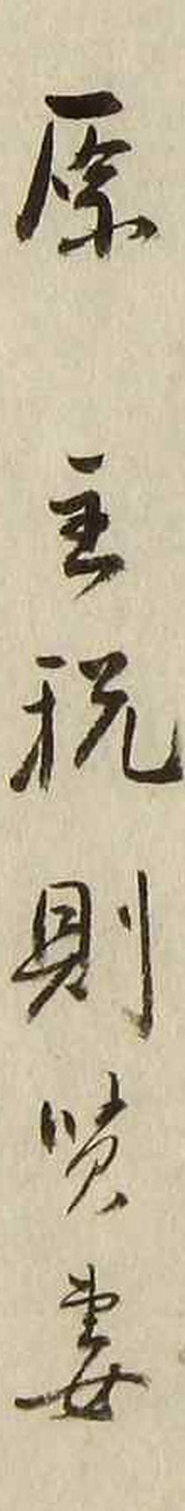女原主税則賢妻

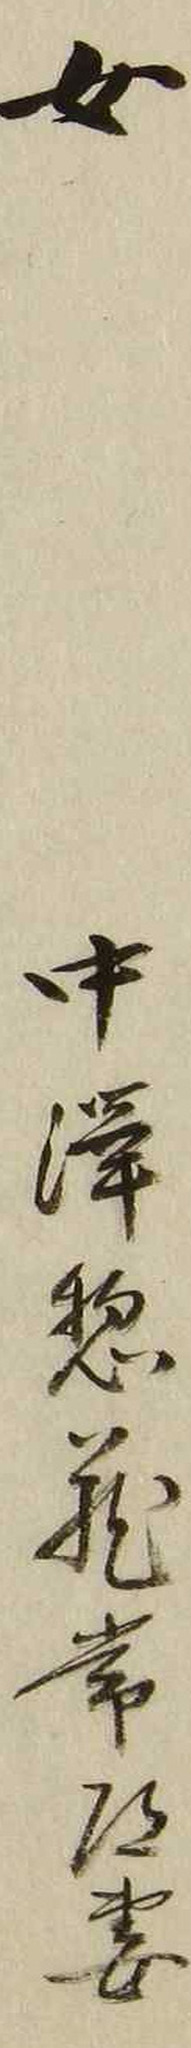女中沢惣蔵常道妻
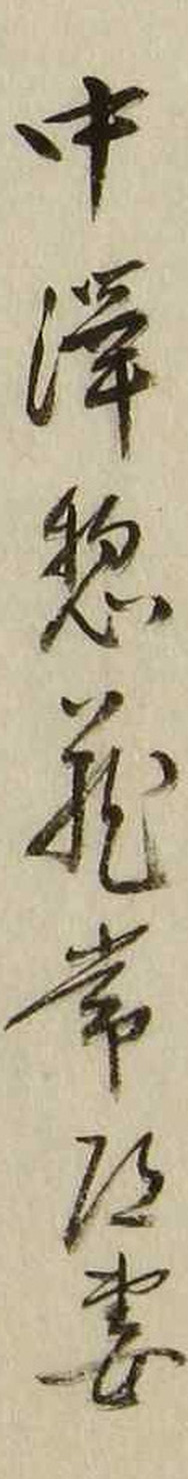女中沢惣蔵常道妻
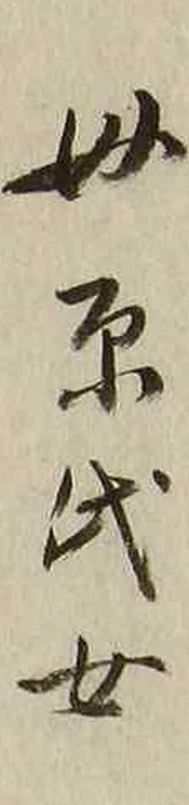母原氏女
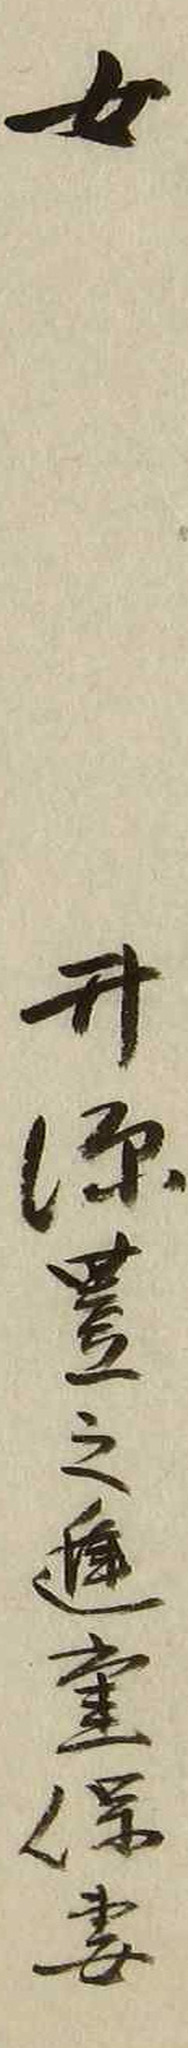女井深豊之進重保妻
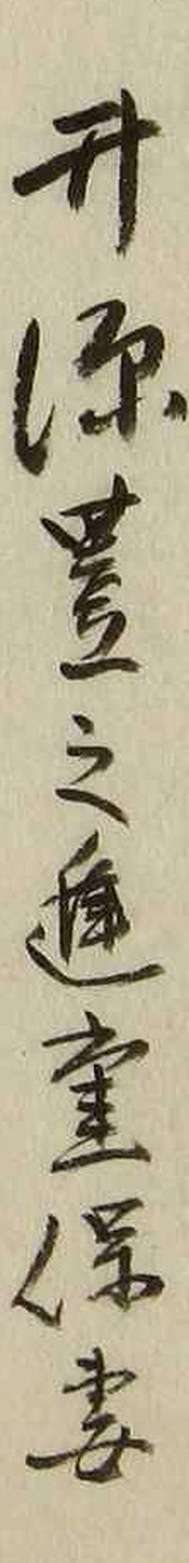女井深豊之進重保妻
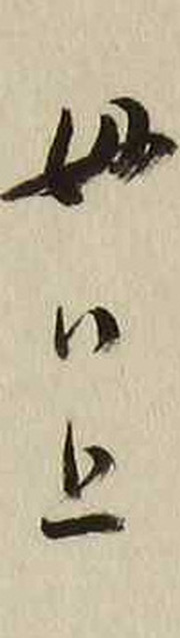母同上

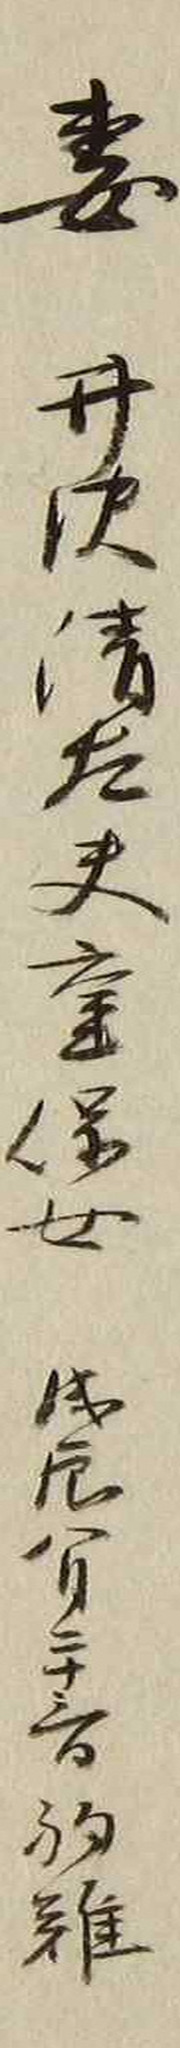妻井沢清太夫重保女戊辰八月二十三日殉難
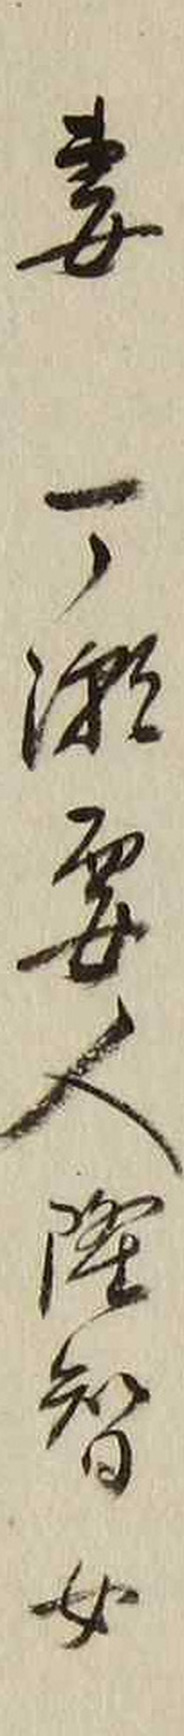妻一ノ瀬要人降智女
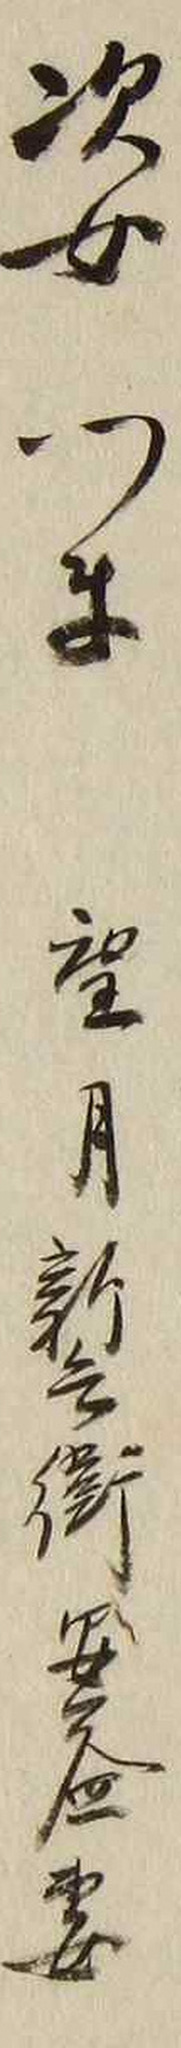次女つま望月新兵衛安益妻

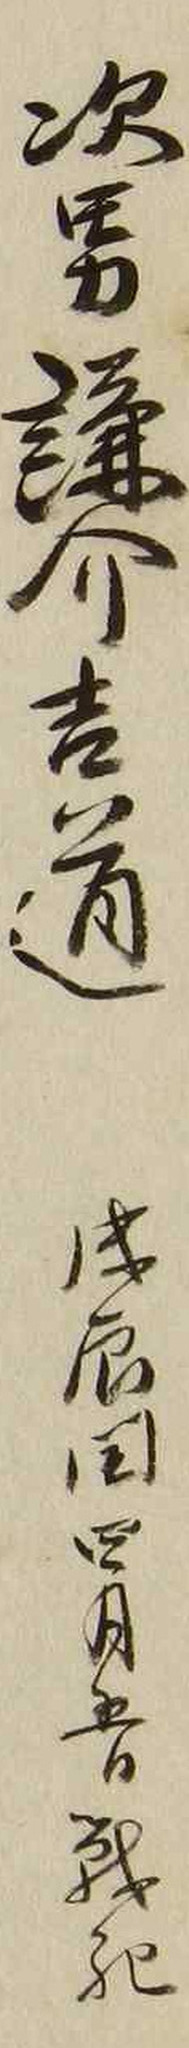次男謙介吉道戊辰閏四月五日戦死
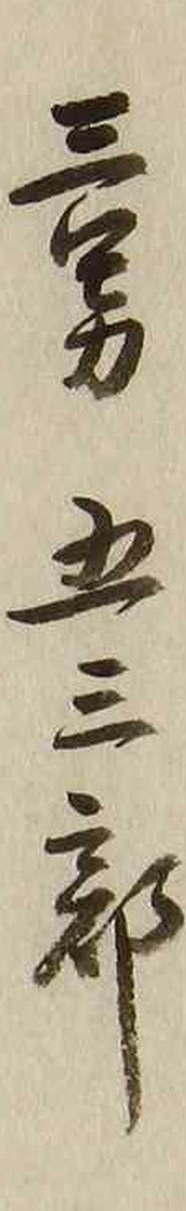三男五三郎
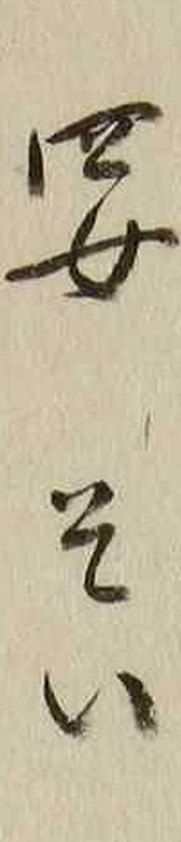四女そい
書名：諸士系譜　巻之311　し之部1
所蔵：会津若松市立会津図書館
